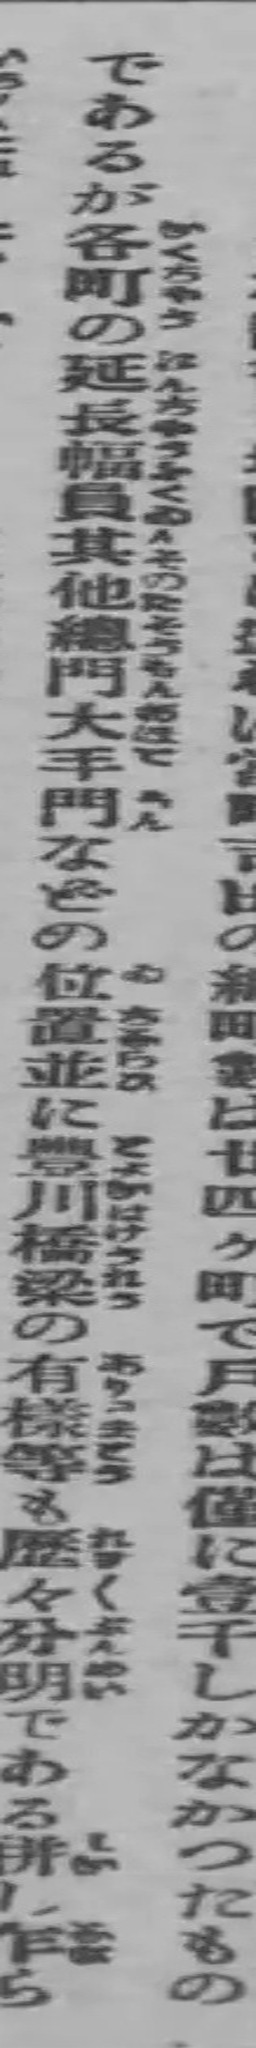であるが各町の延長幅員其他総門大手門などの位置並に豊川橋梁の有様等も歴々分明である併し乍ら
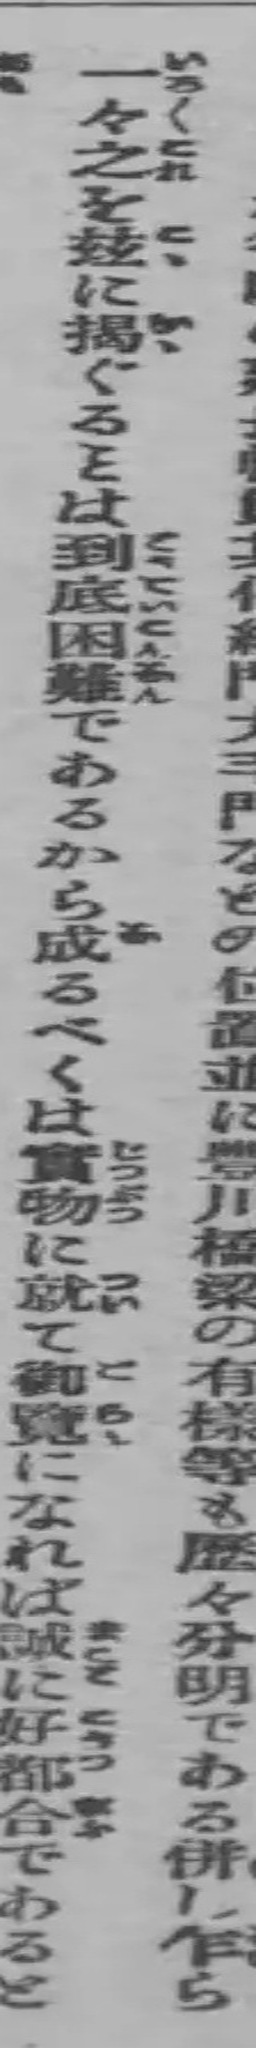一々之を茲に掲ぐることは到底困難であるから成るべくは実物に就て御覧になれば誠に好都合であると
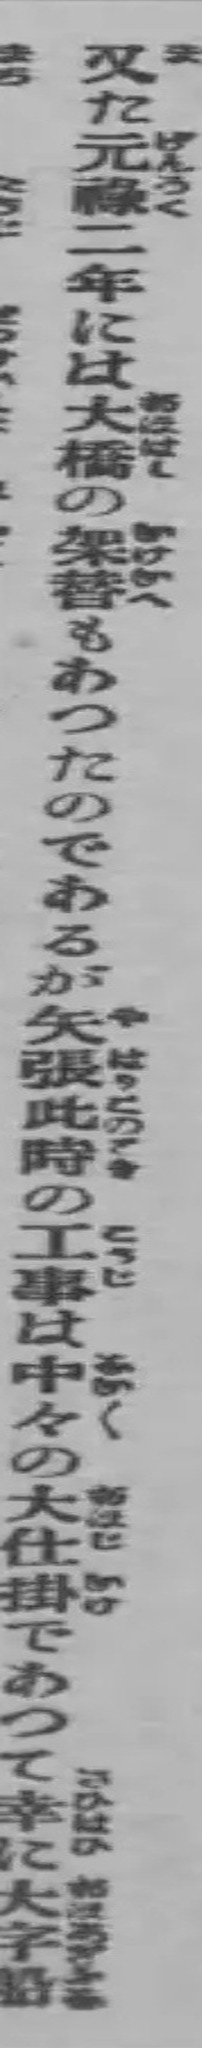又た元禄二年には大橋の架替もあつたのであるが矢張此時の工事は中々の大仕掛であつて幸に大字船
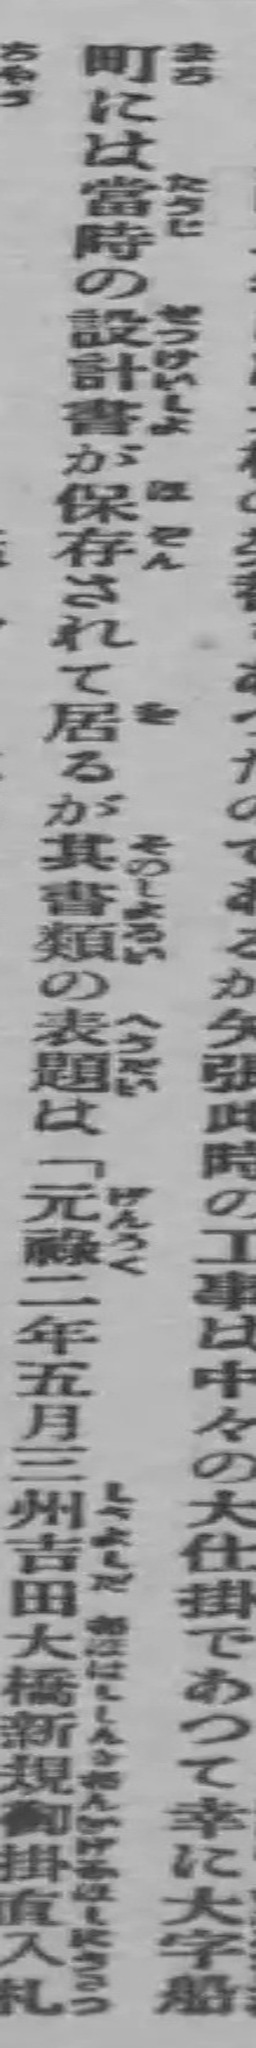橋梁の架替町には当時の設計書が保存されて居るが其書類の表題は「元禄二年五月三州吉田大橋新規御掛直入札
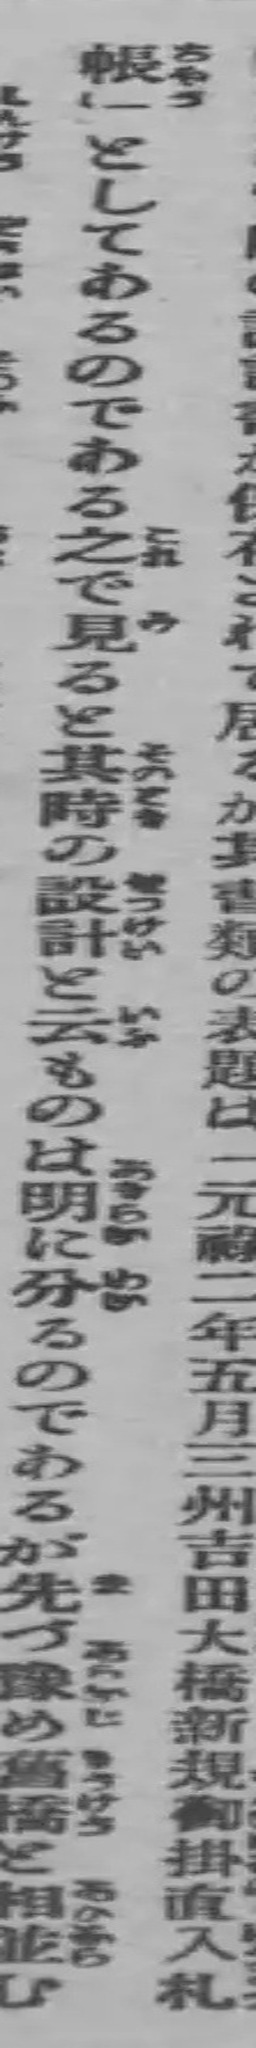帳」としてあるのである之で見ると其時の設計と云ものは明に分るのであるが先づ予め旧橋と相並む
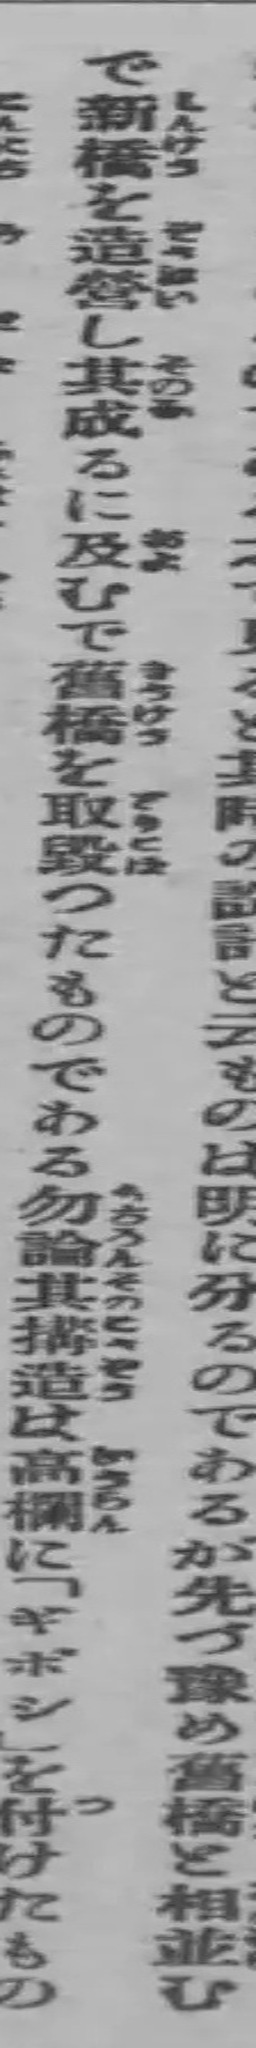で新橋を造営し其成るに及むで旧橋を取毀つたものである勿論其構造は高欄に「ギボシ」を付けたもの
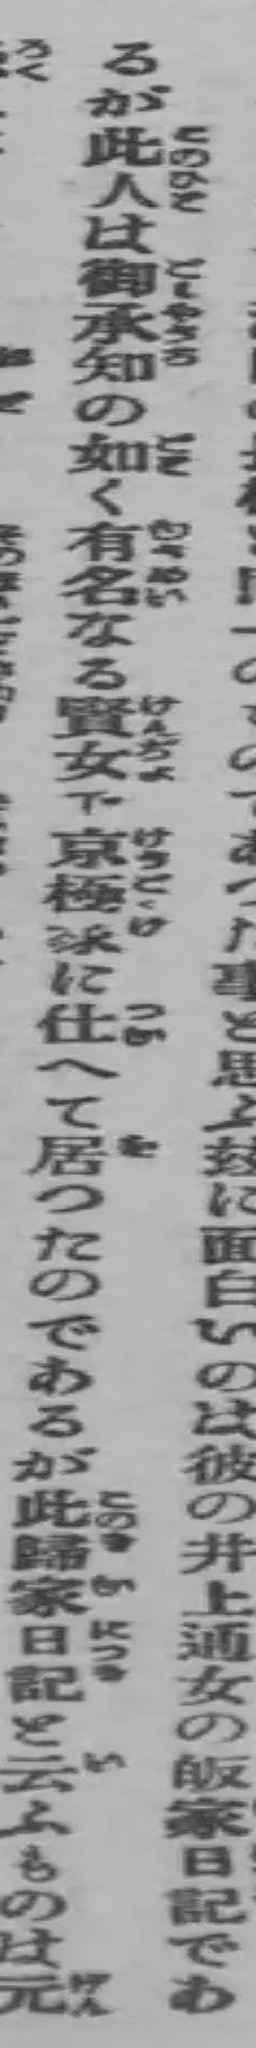るが此人は御承知の如く有名なる賢女で京極家に仕へて居つたのであるが此帰家日記と云ふものは元
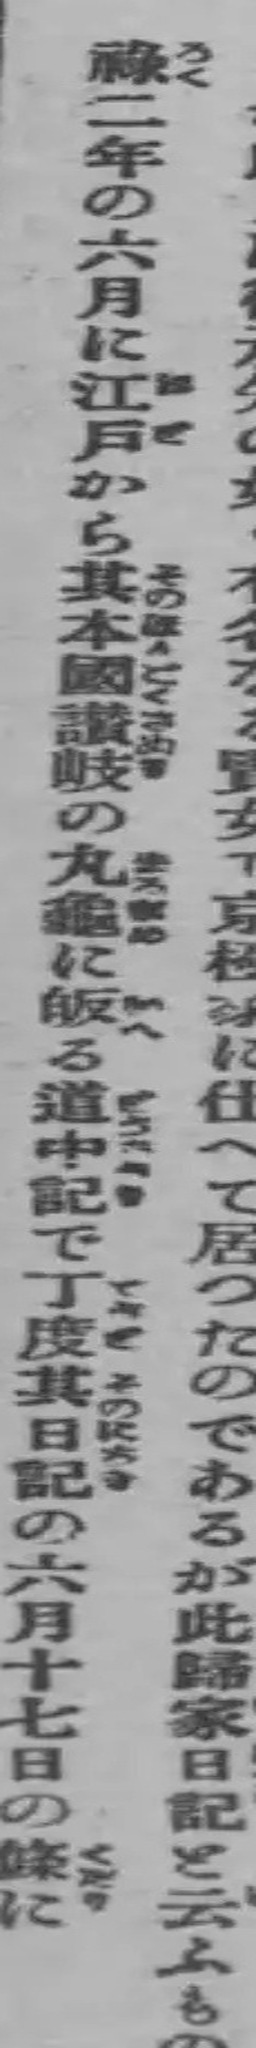禄二年の六月に江戸から其本国讃岐の丸亀に皈る道中記で丁度其日記の六月十七日の条に

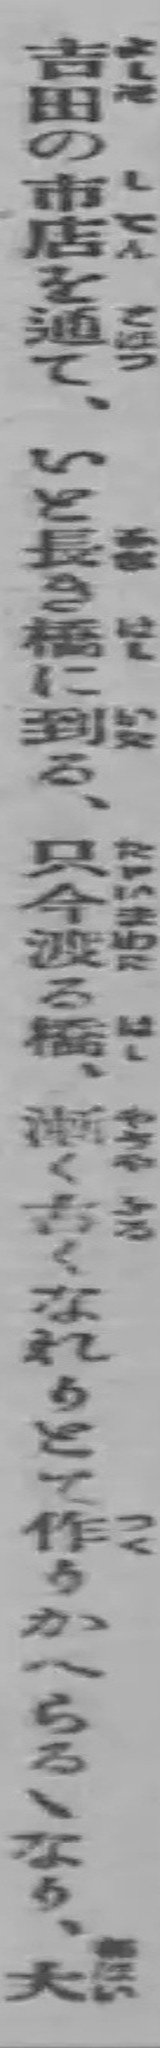吉田の市店を通て、いと長き橋に到る、只今渡る橋、漸く古くなれりとて作りかへらるゝなり、大
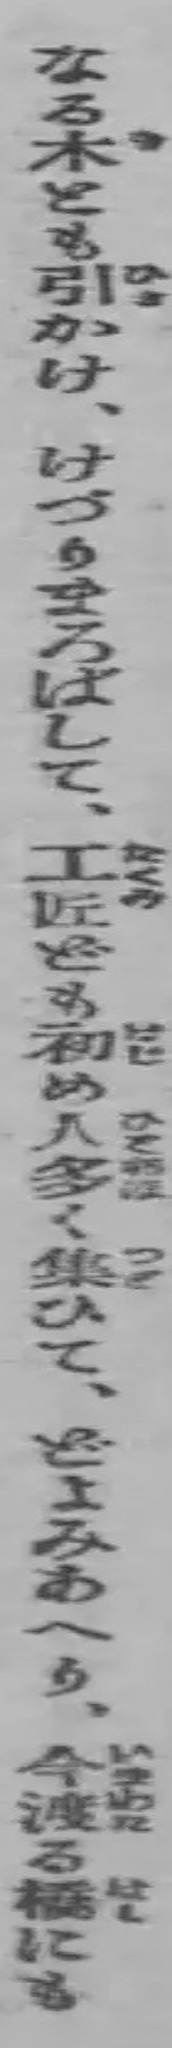なる木とも引かけ、けづりまろばして、工匠ども初め人多く集ひて、どよみあへり、今渡る橋にも
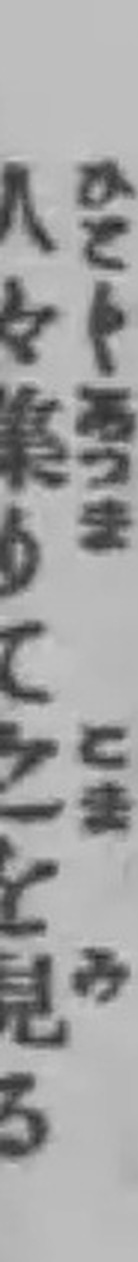人々集りて之を見る
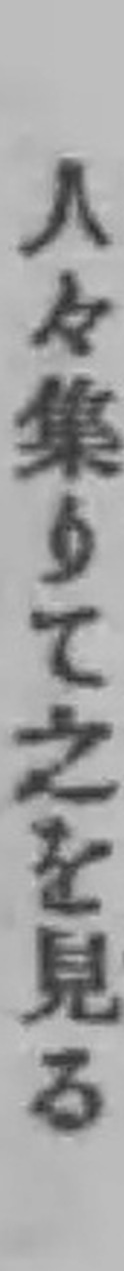人々集りて之を見る
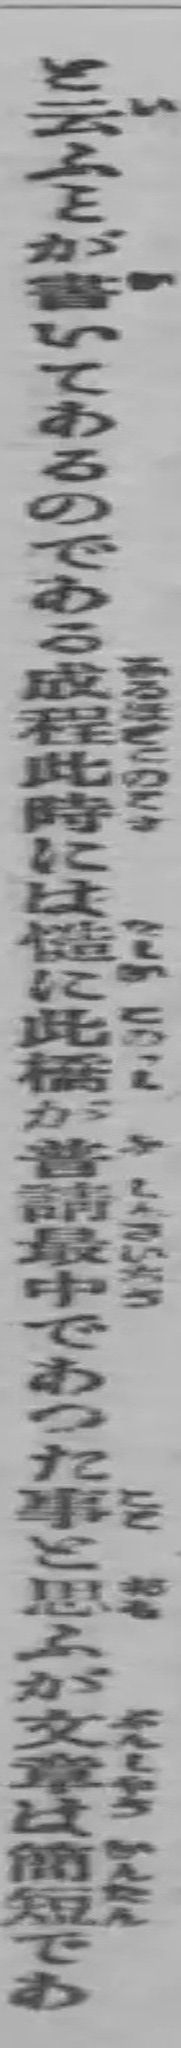と云ふことが書いてあるのである成程此時には慥に此橋が普請最中であつた事と思ふが文章は簡短であ
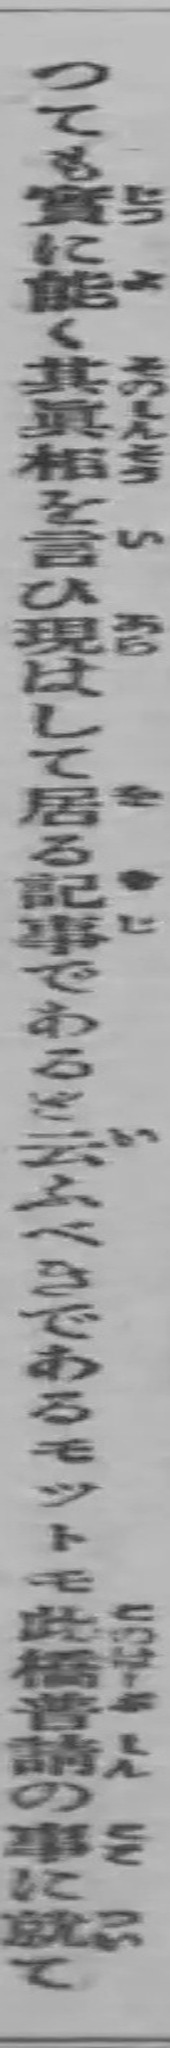つても実に能く其真相を言ひ現はして居る記事であると云ふべきであるモツトモ此橋普請の事に就て
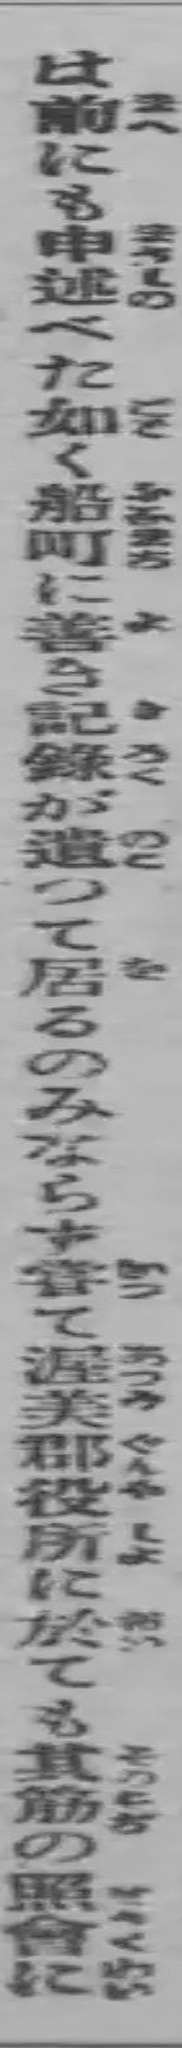は前にも申述べた如く船町に善き記録が遺つて居るのみならず嘗て渥美郡役所に於ても其筋の照会に
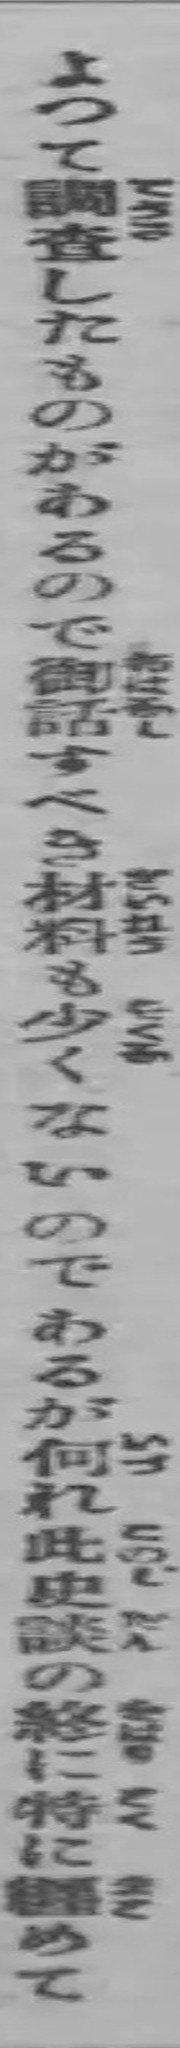よつて調査したものがあるので御話すべき材料も少くないのであるが何れ此史談の終に特に纏めて
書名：豊橋市史談
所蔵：国立国会図書館 National Diet Library, JAPAN
